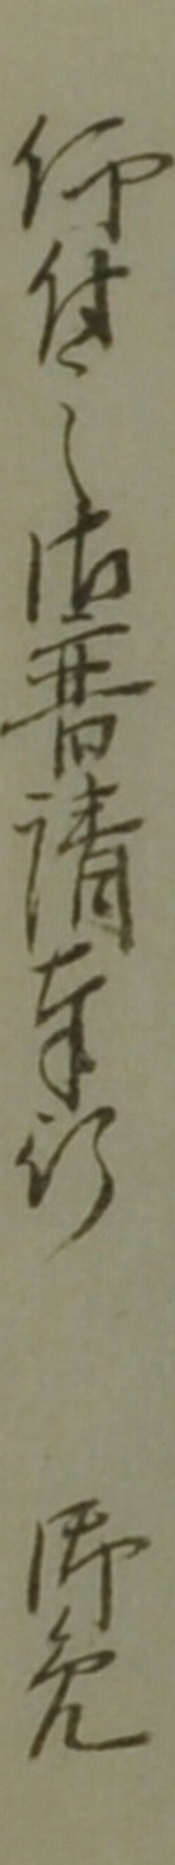仰付之御普請奉行御免
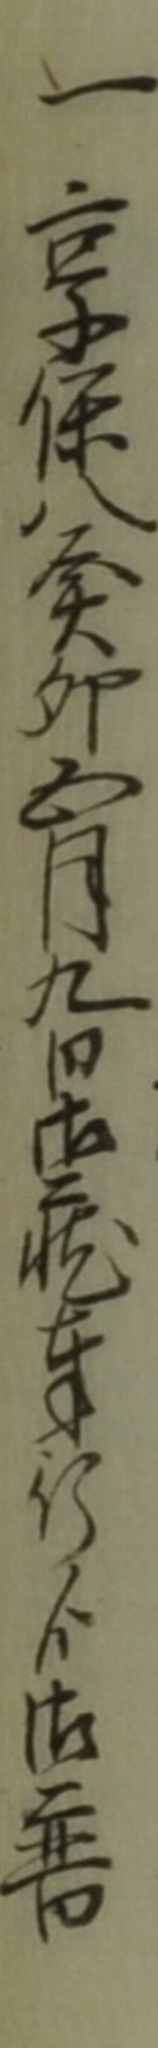一享保八癸卯五月九日御蔵奉行ゟ御普
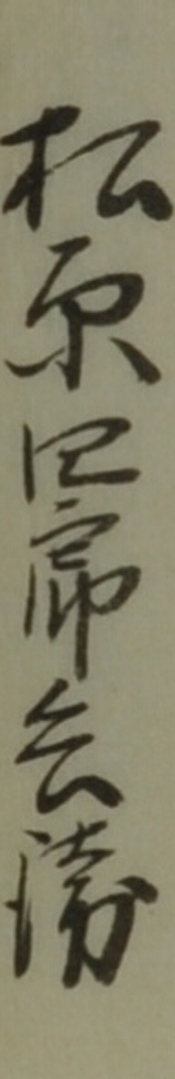松原四郎兵衛
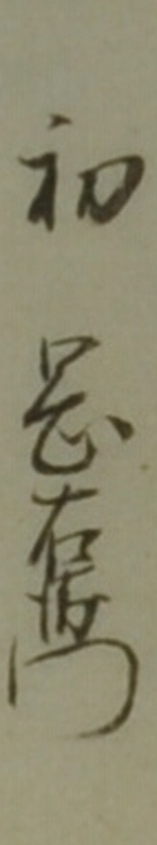初岡右衛門
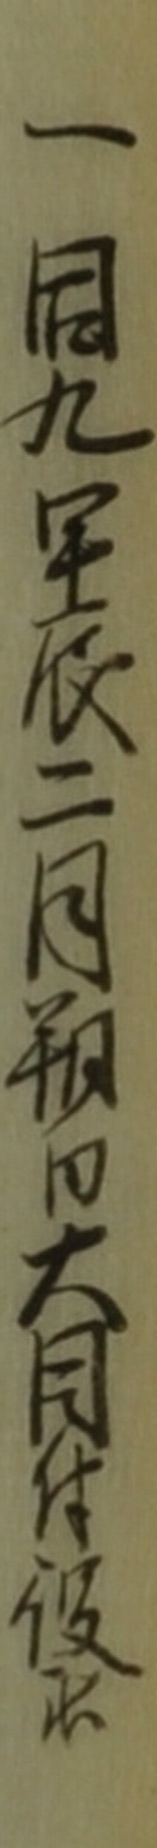一同九甲辰二月朔日大目付役被
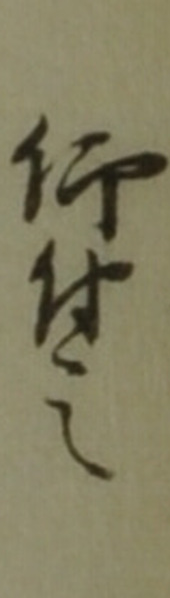仰付之
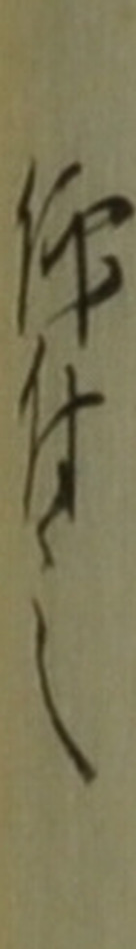仰付之
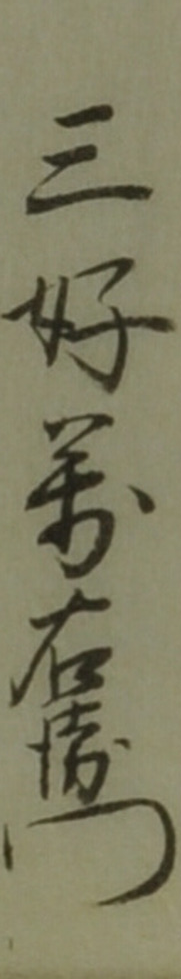三好萬右衛門
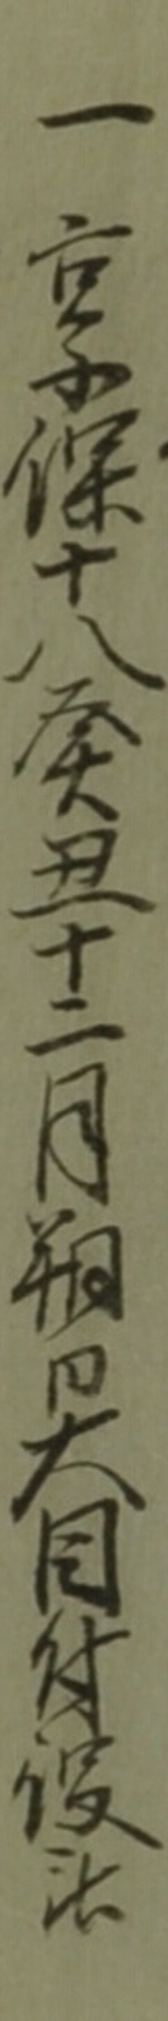一享保十八癸丑十二月朔日大目付役被
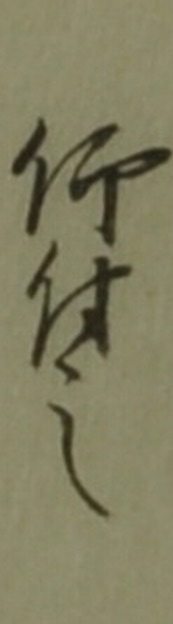仰付之
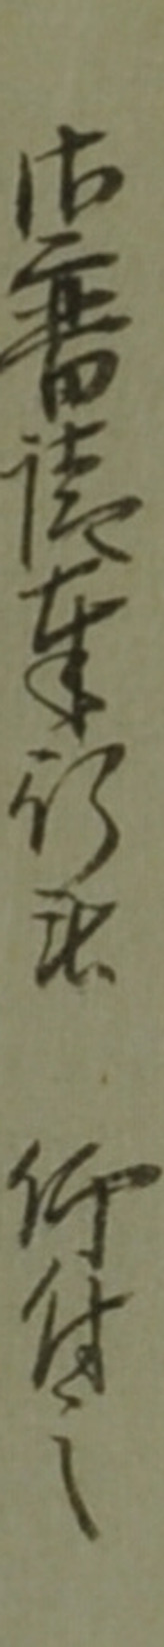御普請奉行被仰付之
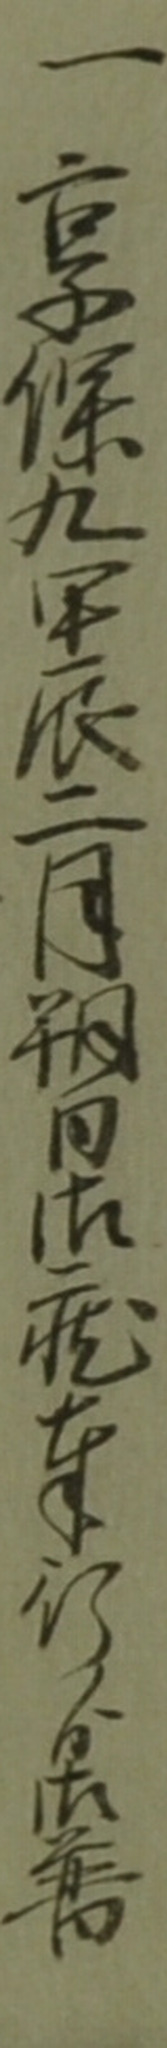一享保九甲辰二月朔日御蔵奉行ゟ御普
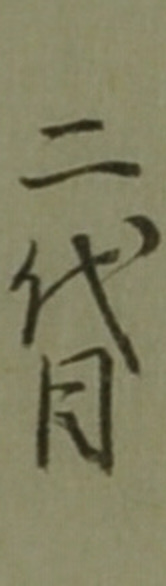二代目
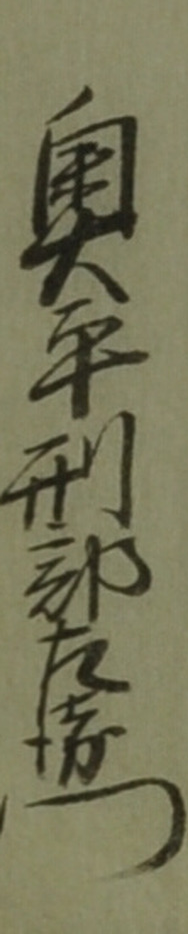奥平刑部左衛門
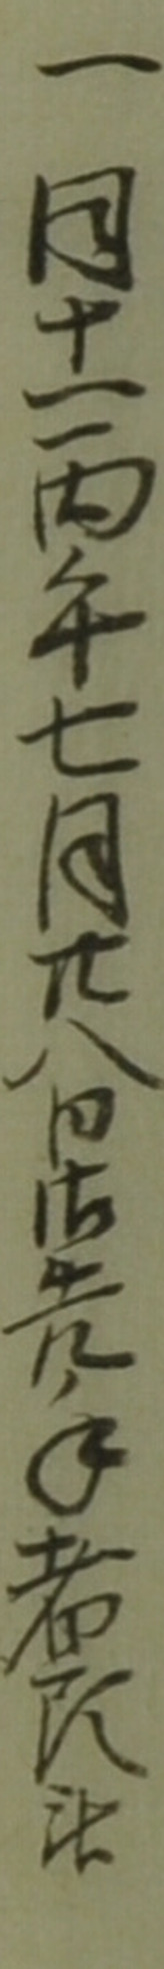一同十一丙午七月廿八日御先手者頭被
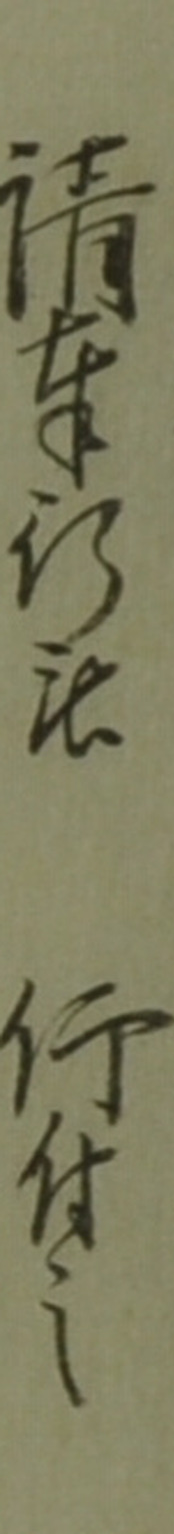請奉行被仰付之
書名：諸御役代々録（六）
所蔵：伊那市立高遠町図書館・合同会社AMANE
